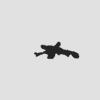敬
